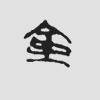倉
